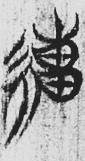○（申）
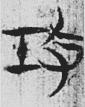攻（功）
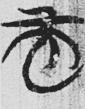而
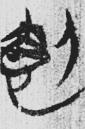○（食）
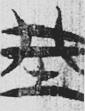○（刑）
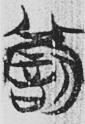罰
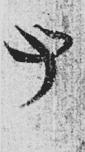又（有）
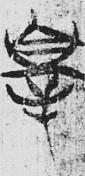辠
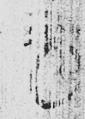而
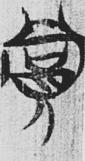賞
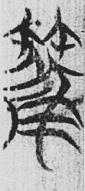○（爵）
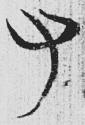又（有）
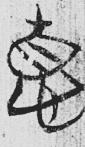惪
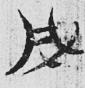凡
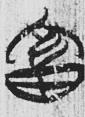畜
